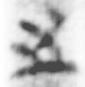之
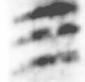三
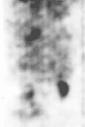屯
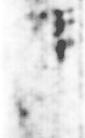麗
